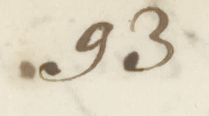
93
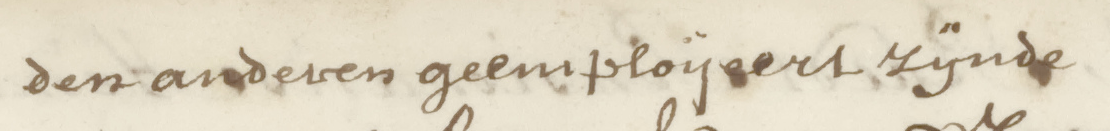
den anderen geemploijeert zijnde
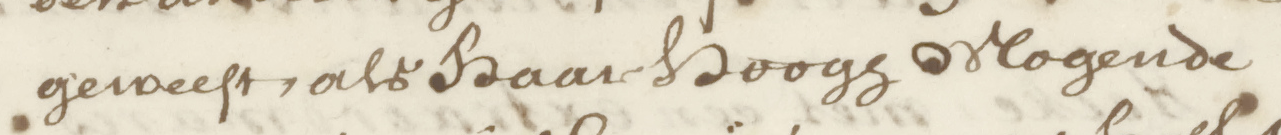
geweest, als haar Hoogh Mogende
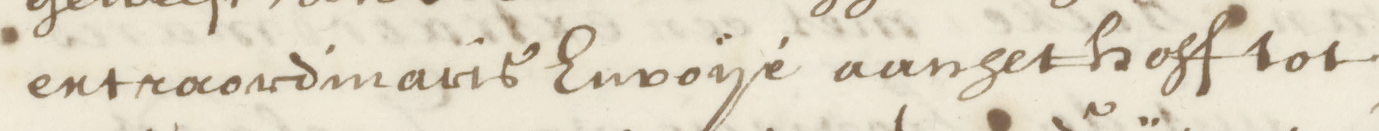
extraordinaris Envoijé aan het hoff tot
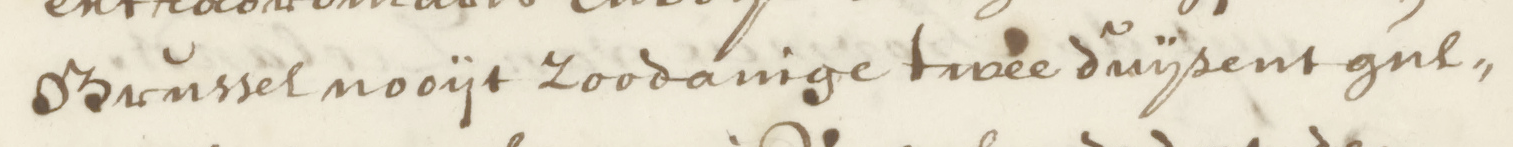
Brussel nooijt zoodanige twee duijsent gul„
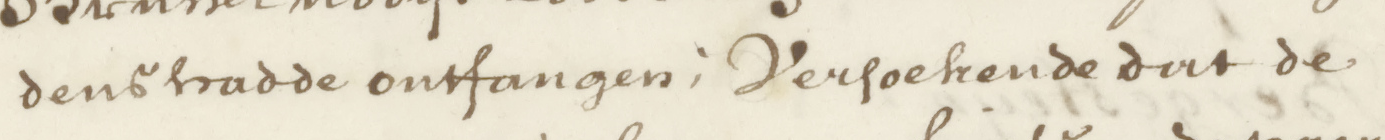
dens hadde ontfangen; Versoekende dat de
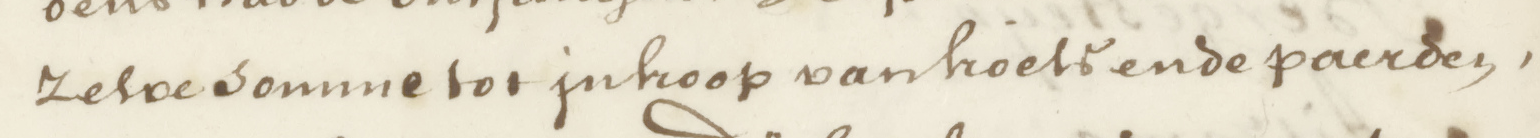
zelve somme tot inkoop van koets ende paerden,
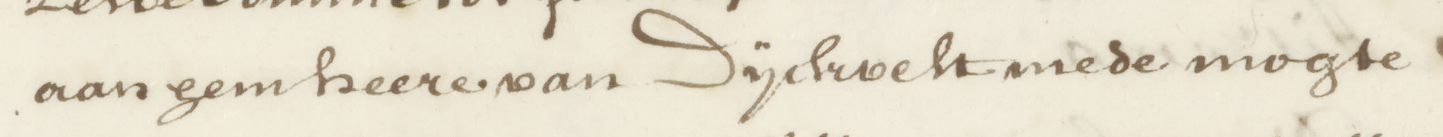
aan hem heere van Dijckvelt mede mogte
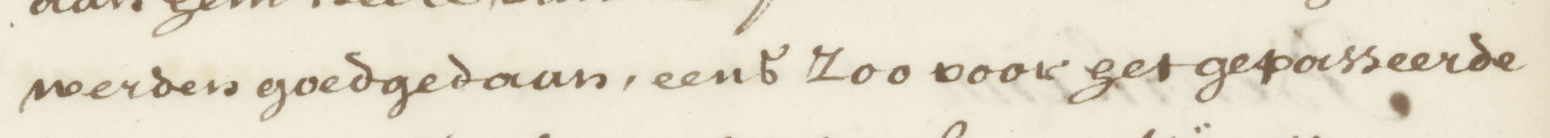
werden goedgedaan, eens zoo voor het gepasseerde
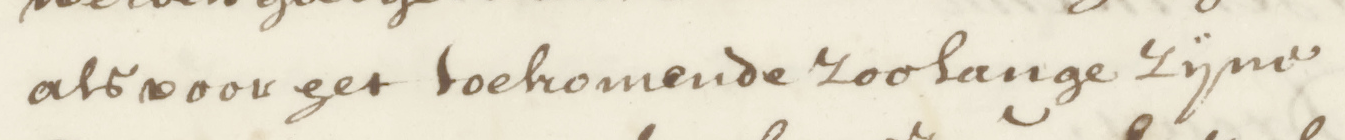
als voor het toekomende zoo lange zijne
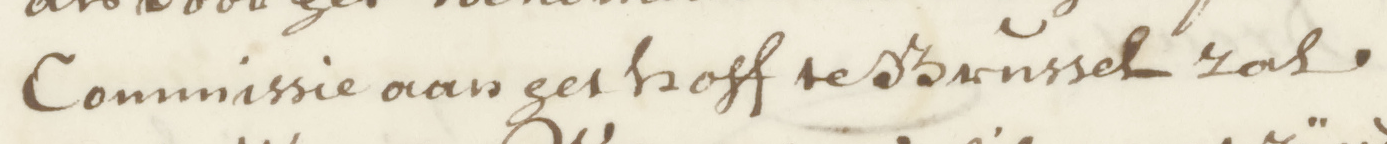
Commissie aan het hoff te Brussel zal
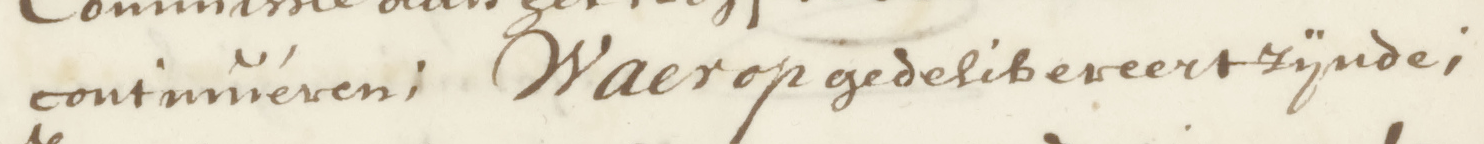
continueren; Waerop gedelibereert zijnde,
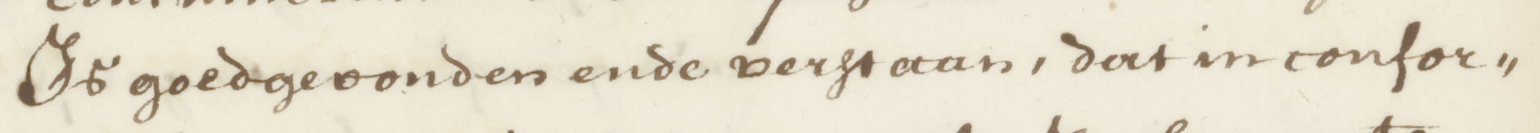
Is goedgevonden ende verstaan, dat in confor„
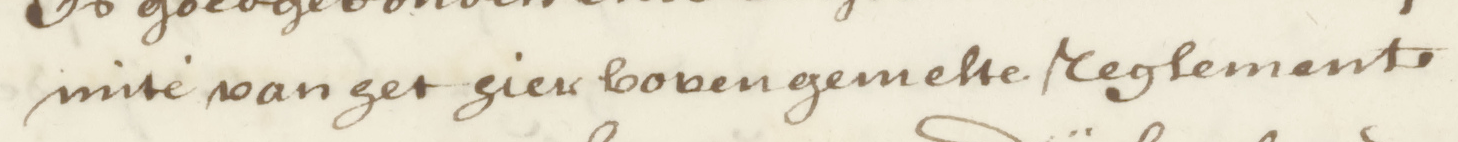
mité van het hier bovengemelte reglement
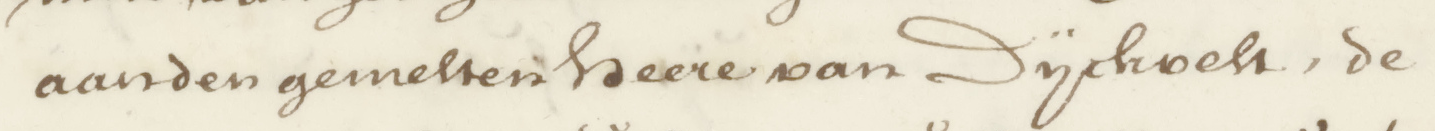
aanden gemelten heere van Dijckvelt, de
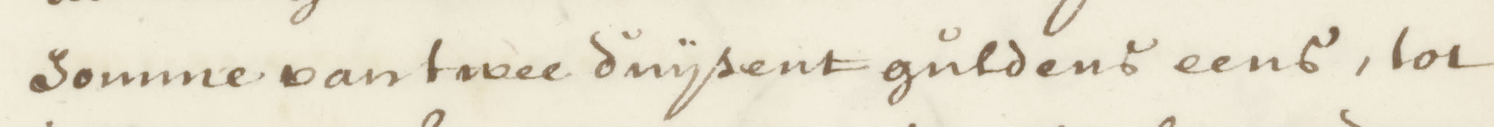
somme van tweeduijsent guldens eens, tot
